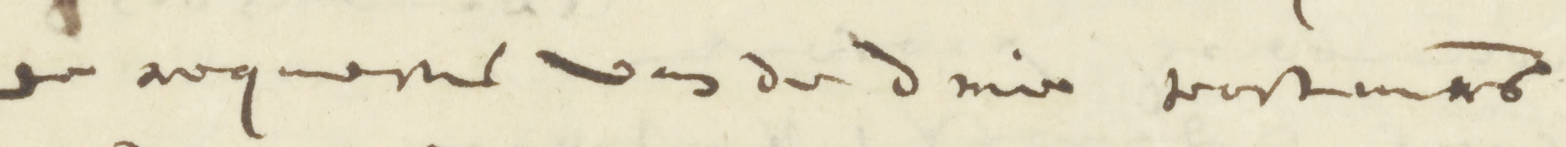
De requeste van de drie postmrs
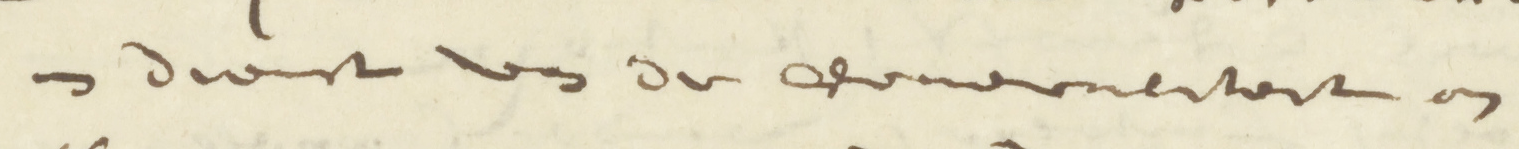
in dienst van de Generaliteit om
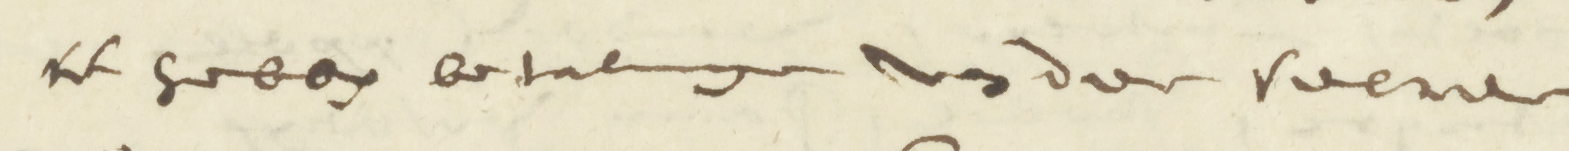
te hebben betalinge van der selve
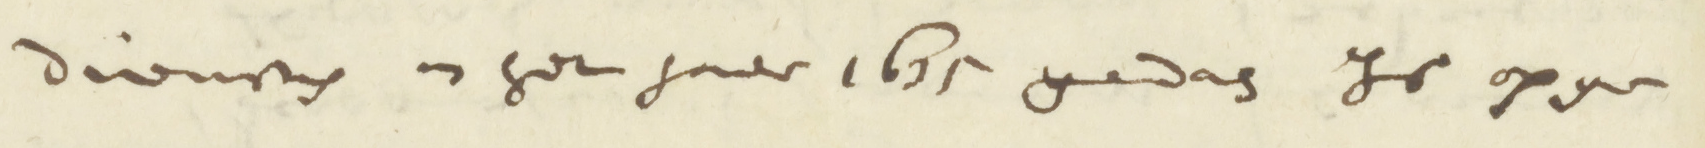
diensten in het jaer 1635 gedaen Is opge
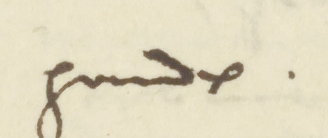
houden.
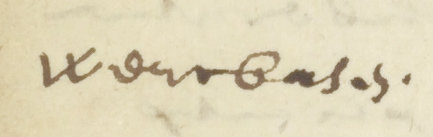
Wercbasen
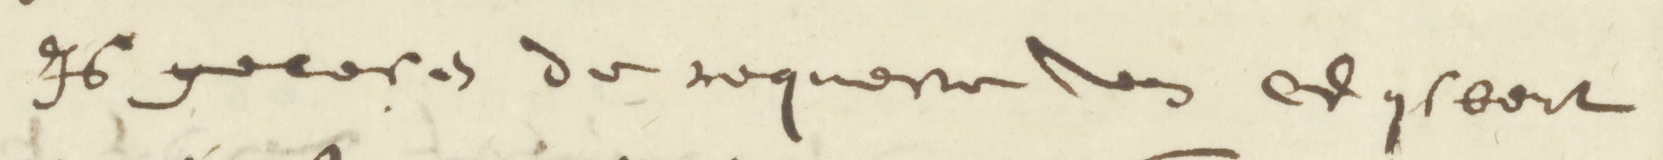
Is gelesen de requeste van Gysbert
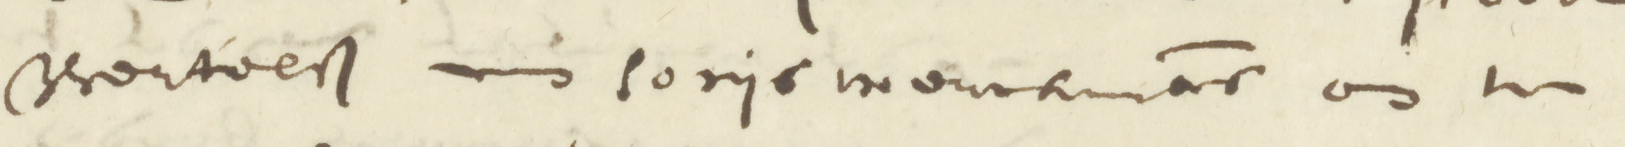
Bertels cum socijs werckmrs om te
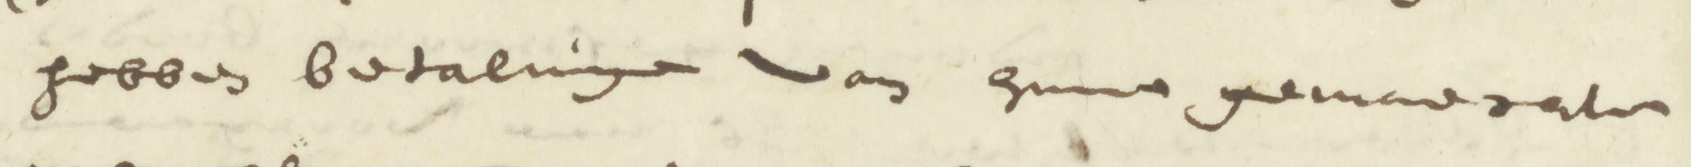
hebben betalinge van hunne gemaeckte
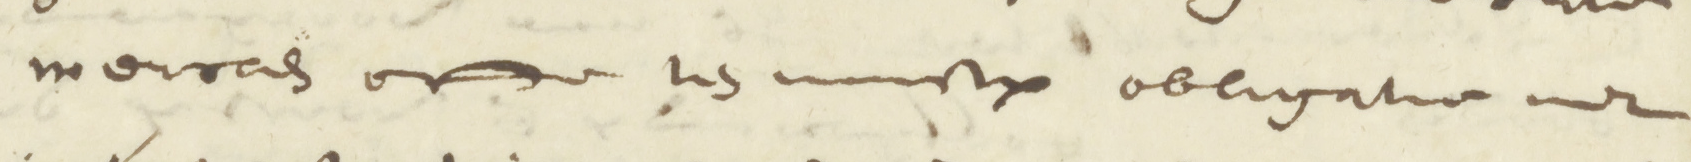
wercken ofte ten minsten obligatie met
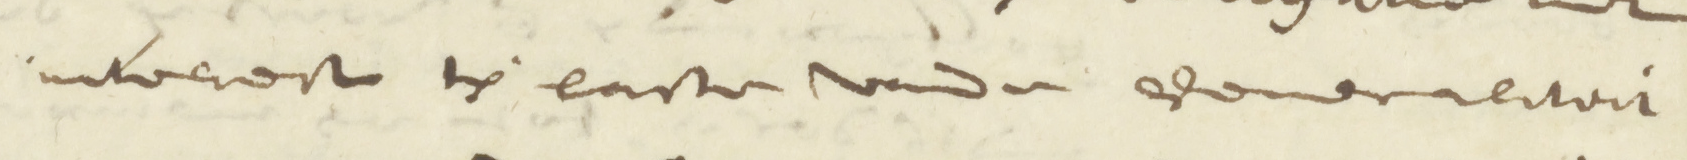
interest ten laste vande Generaliteit
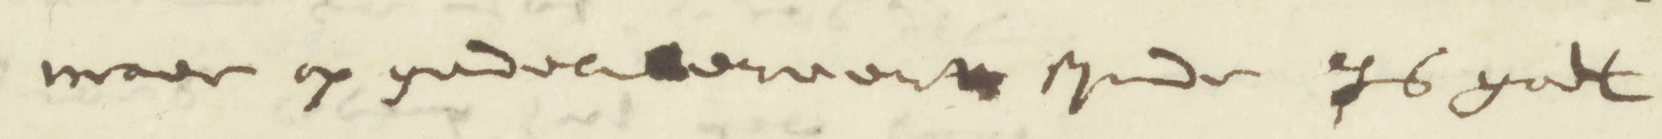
waer op gedelibereert synde Is goet
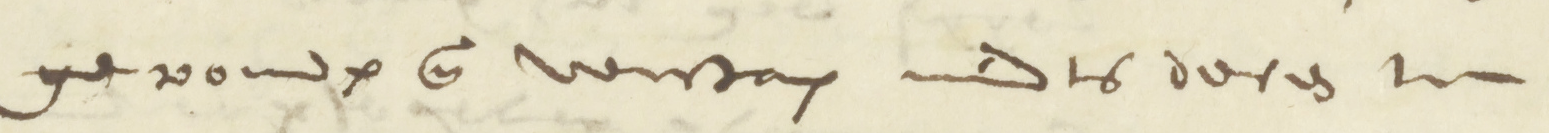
gevonden & verstaen midts desen te
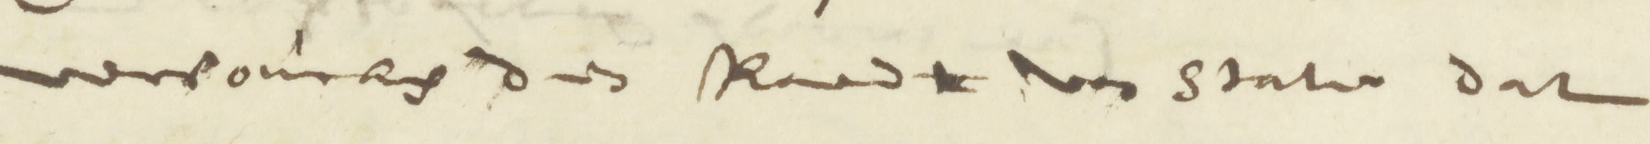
versoucken den Raedt van State dat
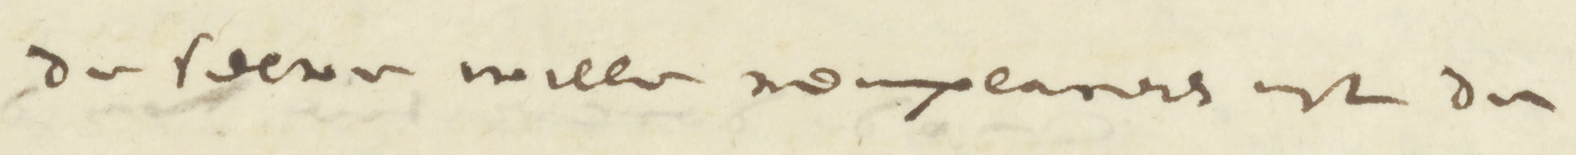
de selve willen remplaceren uyt den
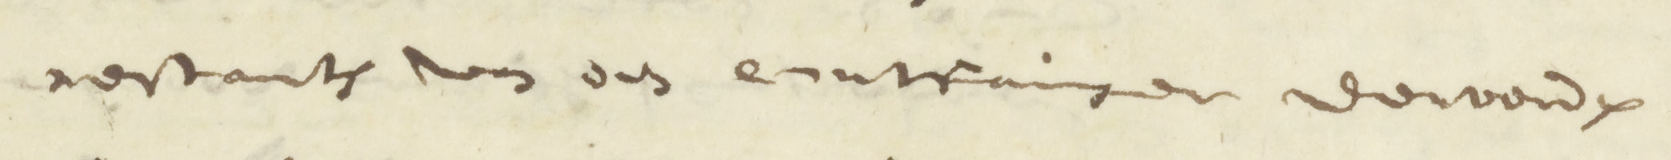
restanten van den ontvanger Deuverden
